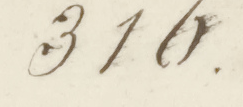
316.
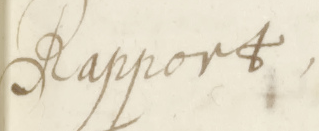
Rapport.
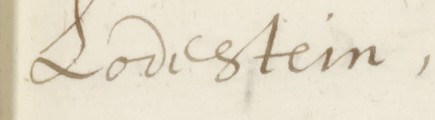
Lodestein.
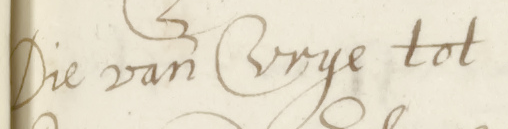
die van Vrye tot
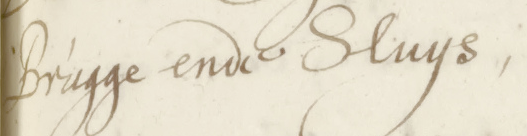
Brugge ende Sluys.
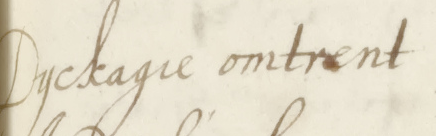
Dyckagie ontrent
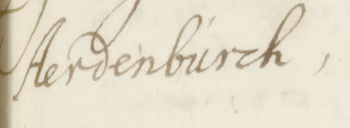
Aerdenburch.
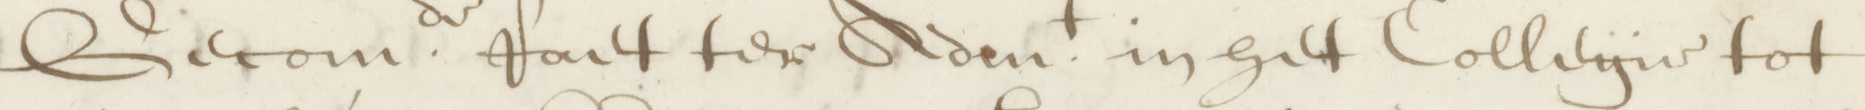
Gecomde Raet ter Admt. in het Collegie tot
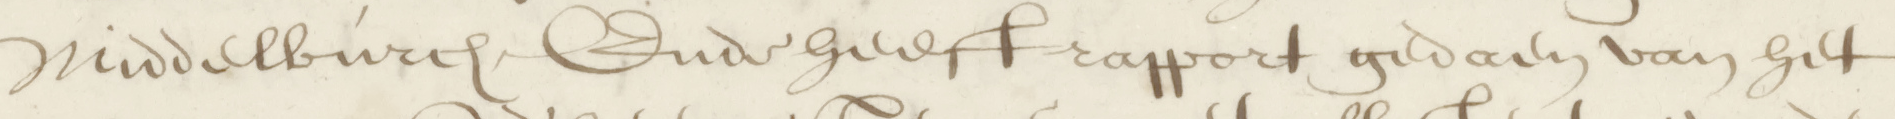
Middelburch, Ende heeft rapport gedaen van het
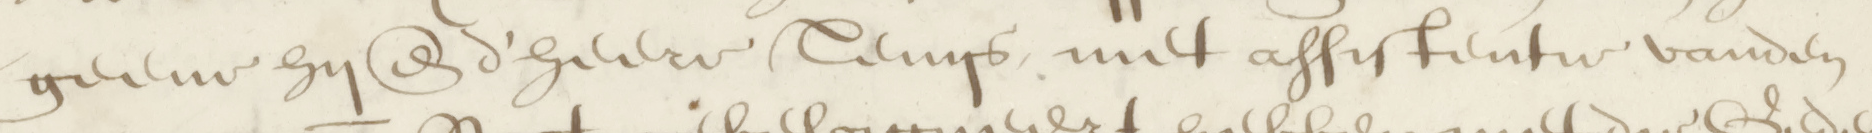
geene hy & d'heere Tenys, met assistentie vanden
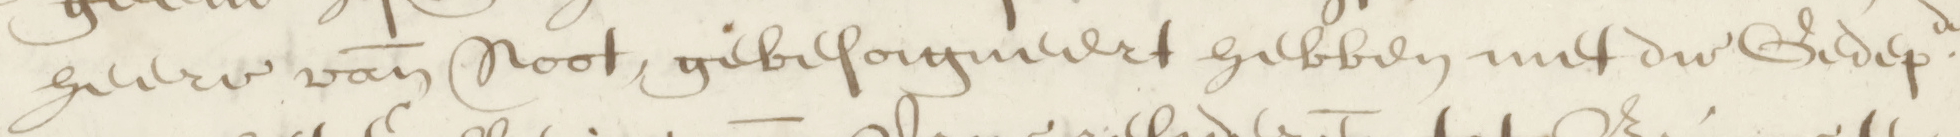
heere van Noot, gebesoigneert hebben met die Gedepde
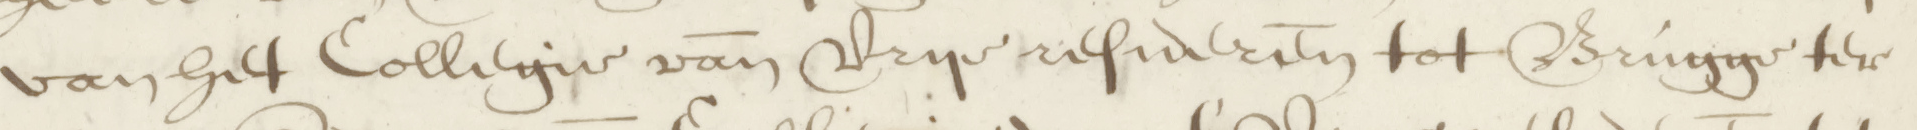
van het Collegie van Vrye resideren tot Brugge ter
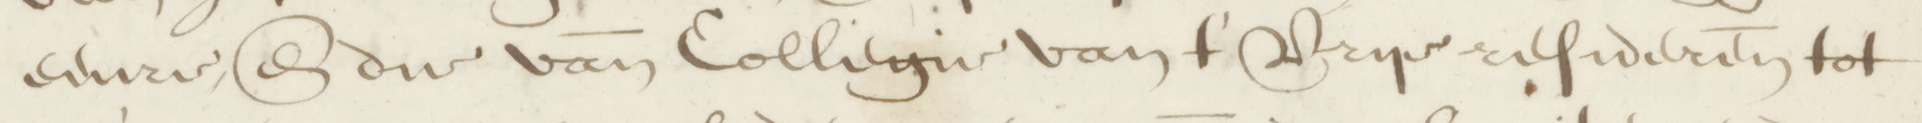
eenre, & die van Collegie van t' Vrye resideren tot
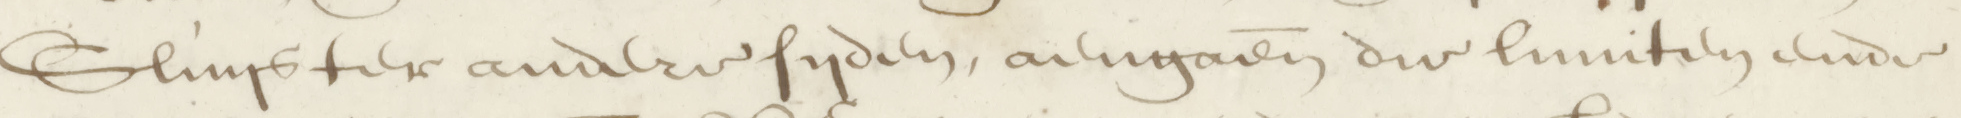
Sluys ter andere syden, aengaen die limiten ende
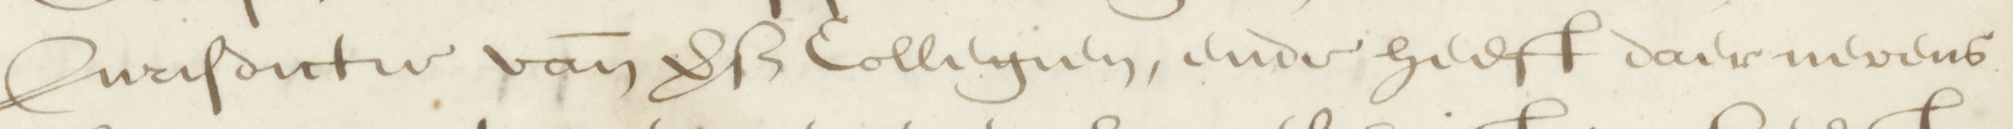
Jurisdictie van vs Collegien, ende heeft daer nevens
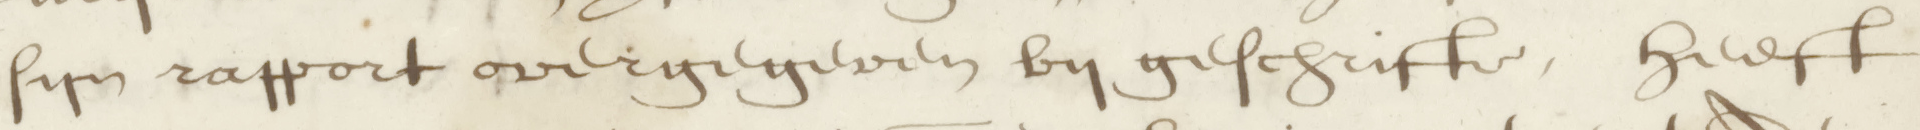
syn rapport overgegeven by geschrifte, heeft
